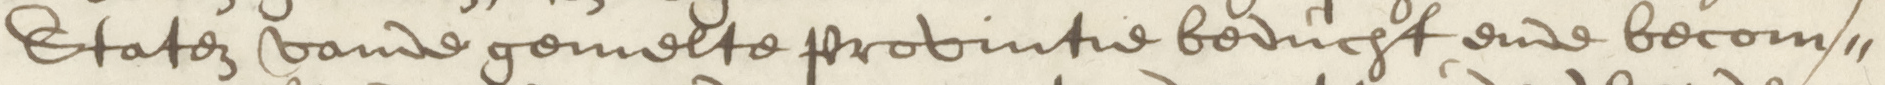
Staten vande gemelte Provintie beducht ende becom„
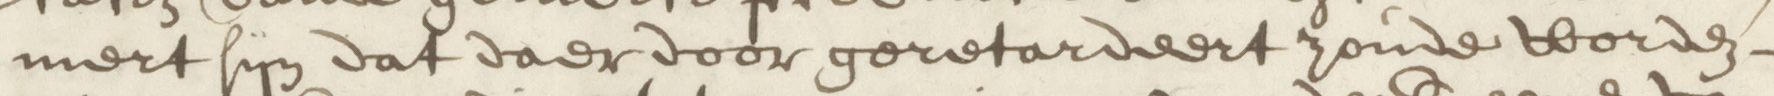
mert sijn dat daer door geretardeert zoude worden —
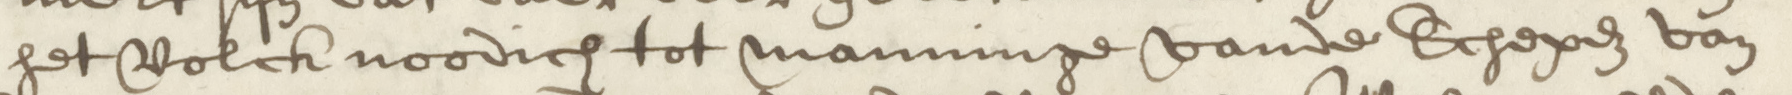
het Volck noodich tot manninge van de Schepen van
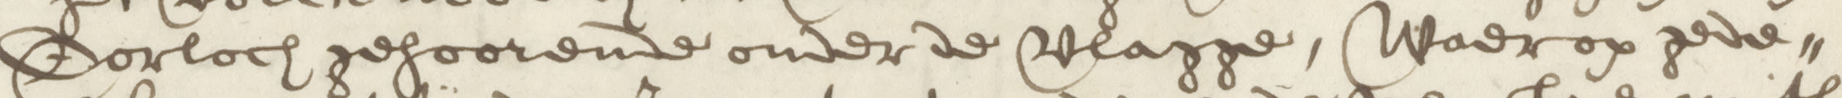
Oorloch gehoorende onder de Vlagge. Waerop gede„
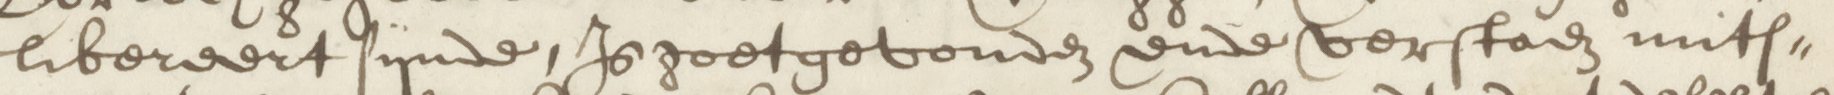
libereert sijnde, Is goetgevonden ende verstaen mits„
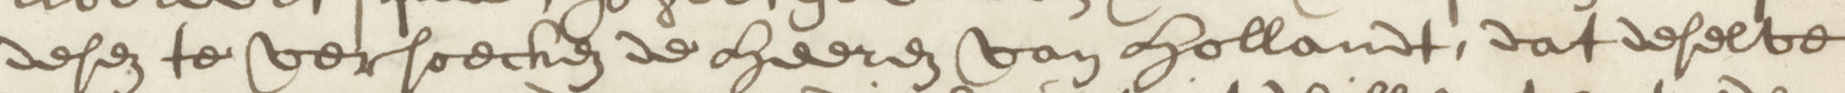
desen te versoecken de Heeren van Hollandt, dat deselve
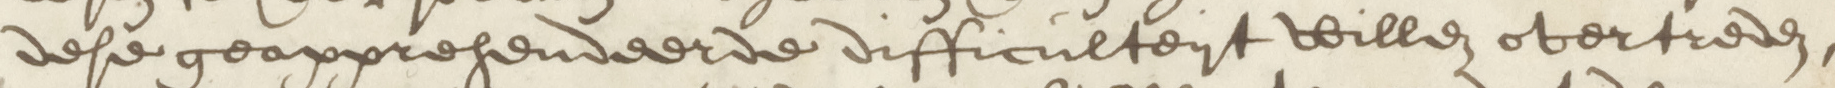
dese geapprehendeerde difficulteijt willen overtreden,
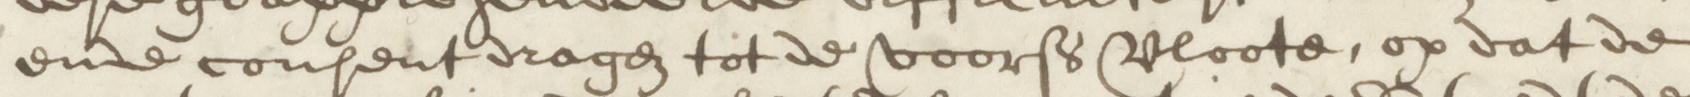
ende consent dragen tot de voorsz Vloote, op dat de
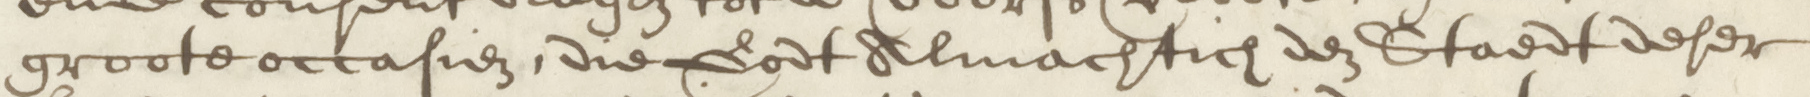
groote occasien, die Godt Almachtich den Staedt deser
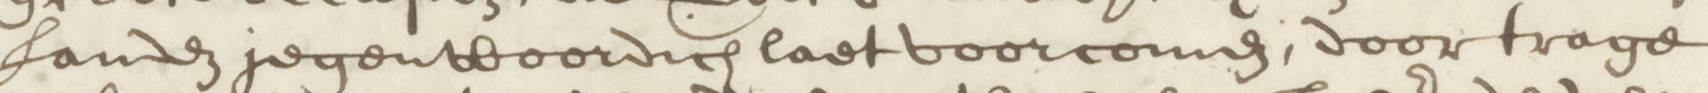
Landen jegenwoordich laet voorcomen, door trage
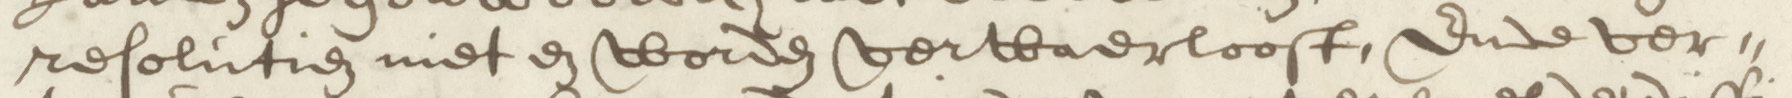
resolutien niet en worden verwaerloost. Ende ver„
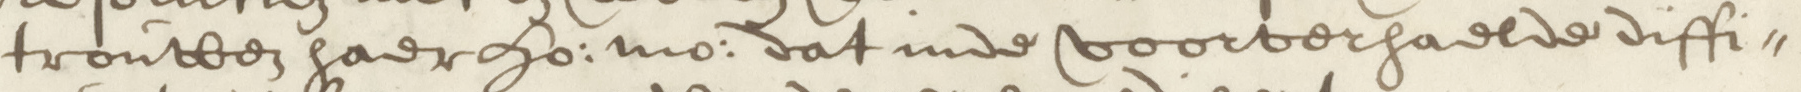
trouwen haer Ho:mo: dat ande voorverhaelde diffi„
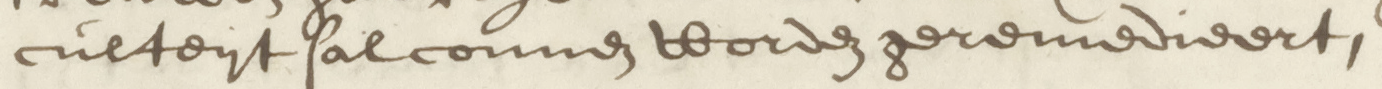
culteijt sal connen worden geremedieert.
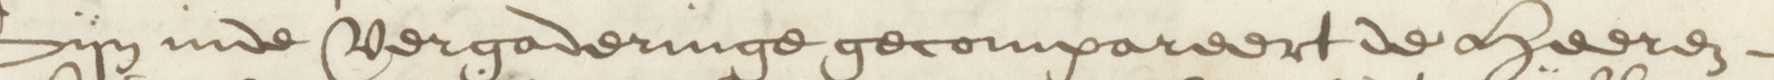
Sijn inde Vergaderinge gecompareert de Heeren —
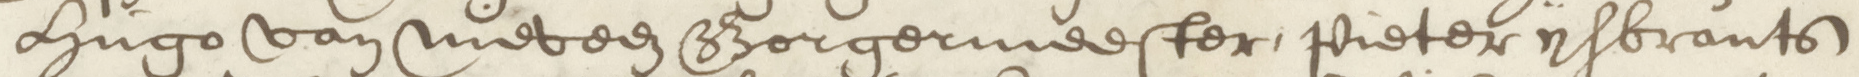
Hugo van Nieveen Borgermeester, Pieter ijsbrants
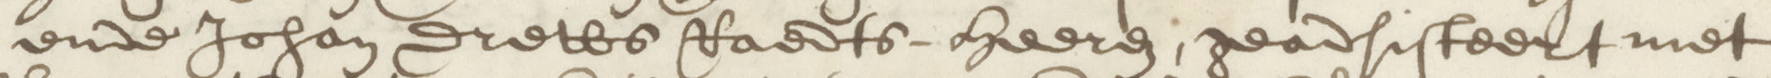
ende Johan Drews Raedts-Heeren, geadsisteert met
